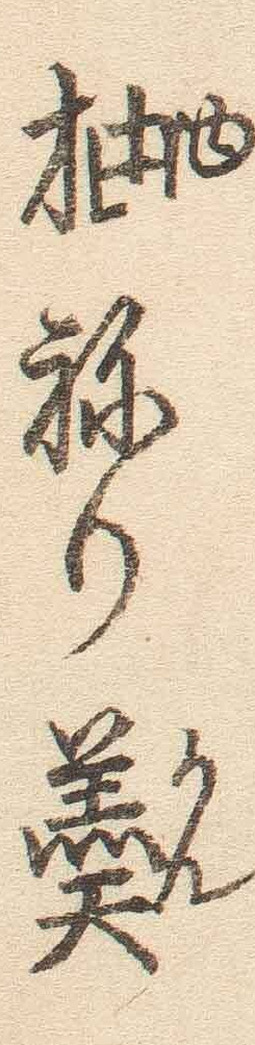柚ねり羹
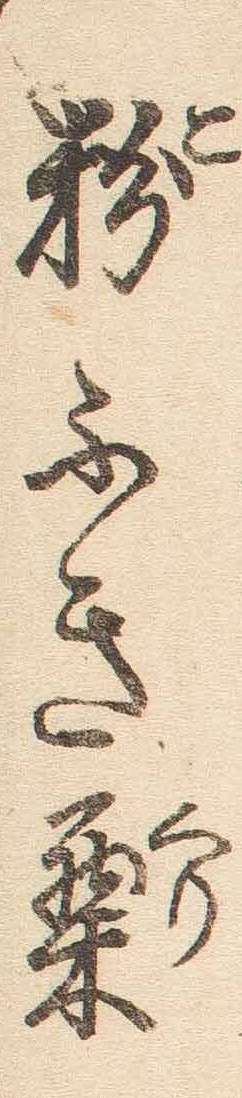粉ふき栗

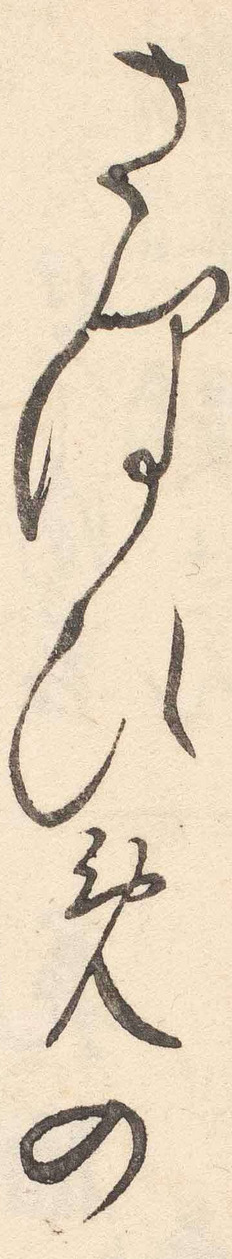さほひめの
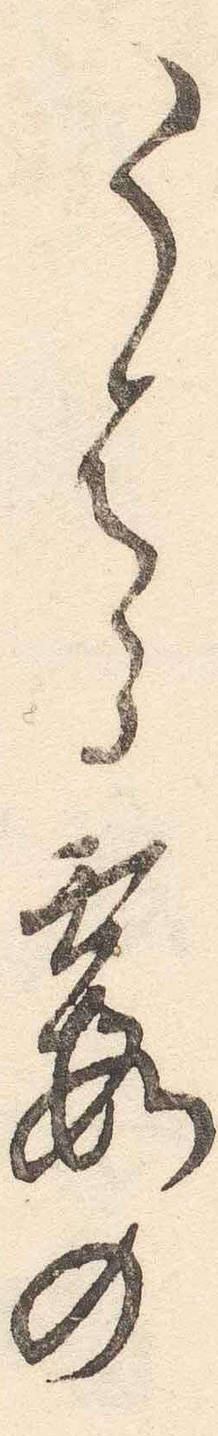くはる霞の
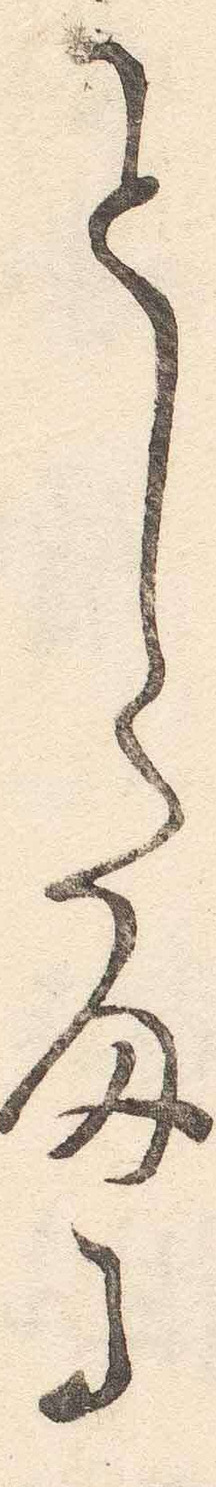としたまに
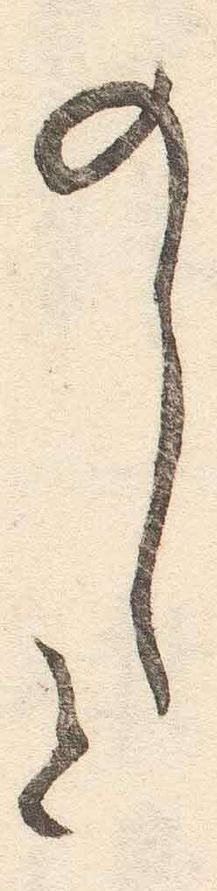のしと
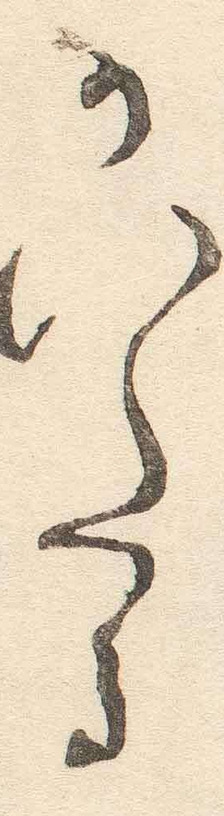かいたる
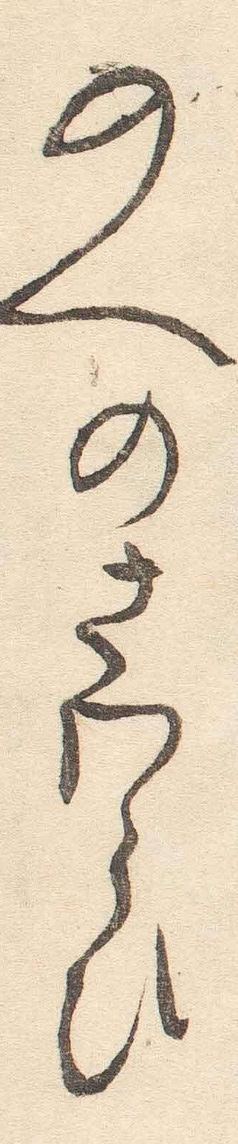のへのさわらひ

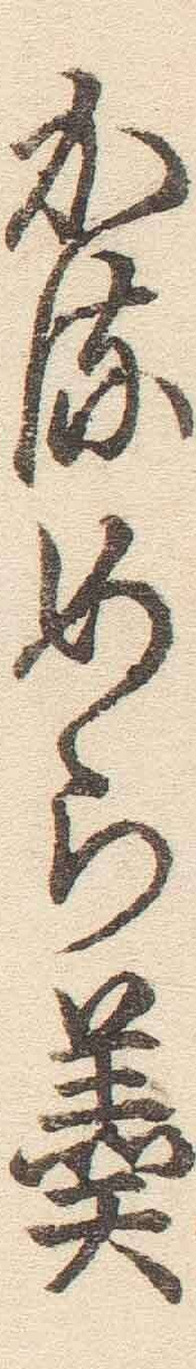かるめら羹
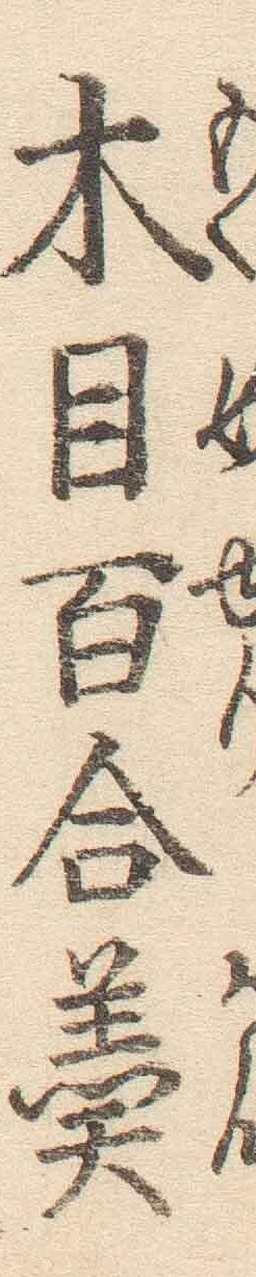木目百合羹
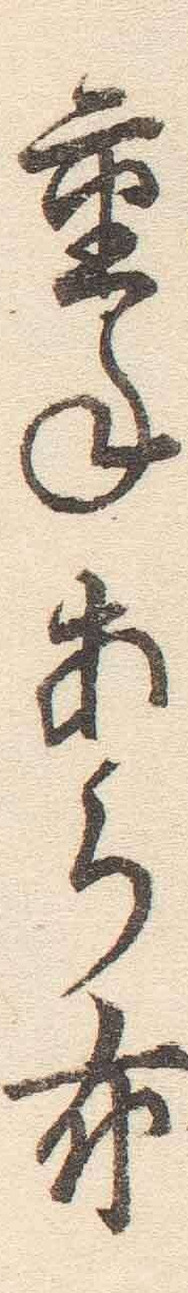重ねあら布
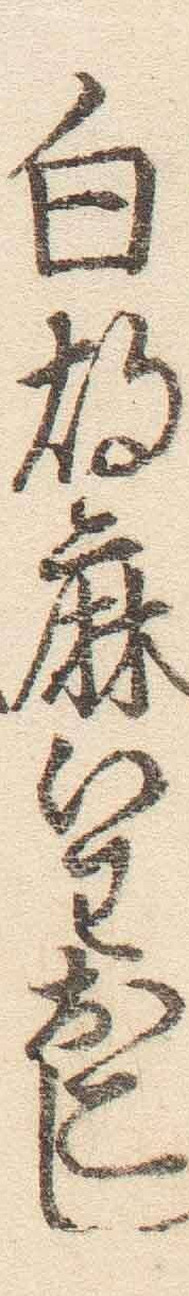白胡麻いわおこし
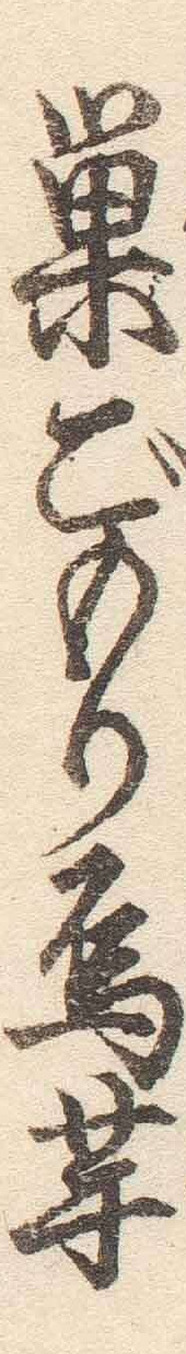巣ごもり烏芋
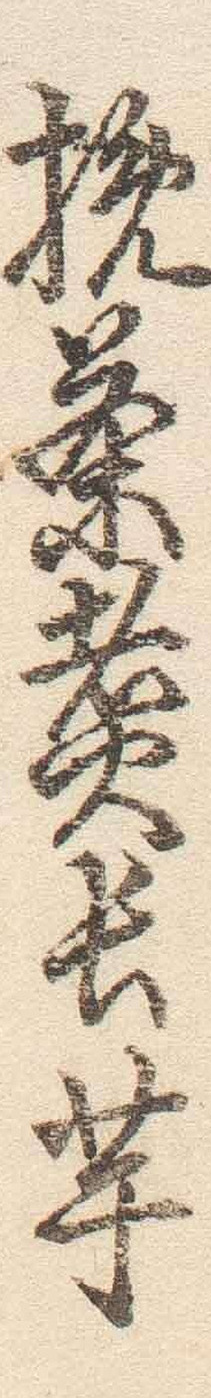挽茶煮長芋
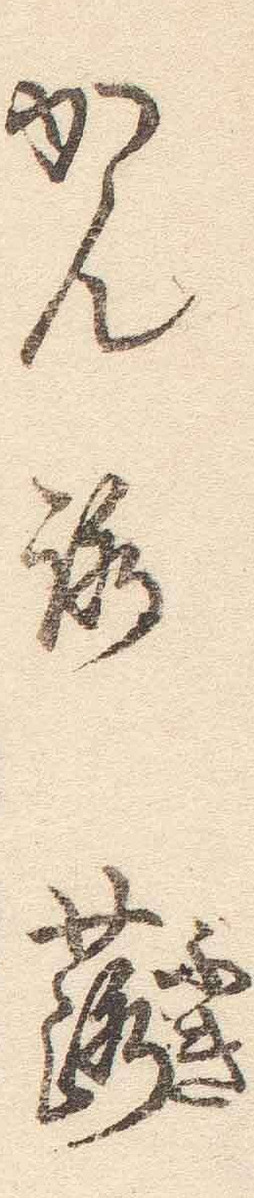かん露蕗
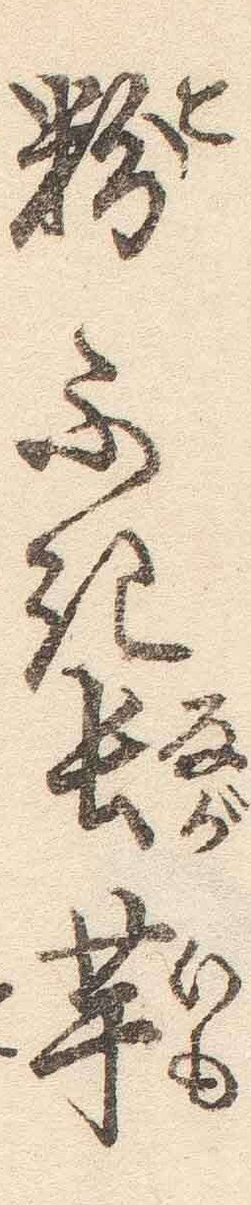粉ふき長芋
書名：料理通
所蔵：東京学芸大学附属図書館 国文学研究資料館
